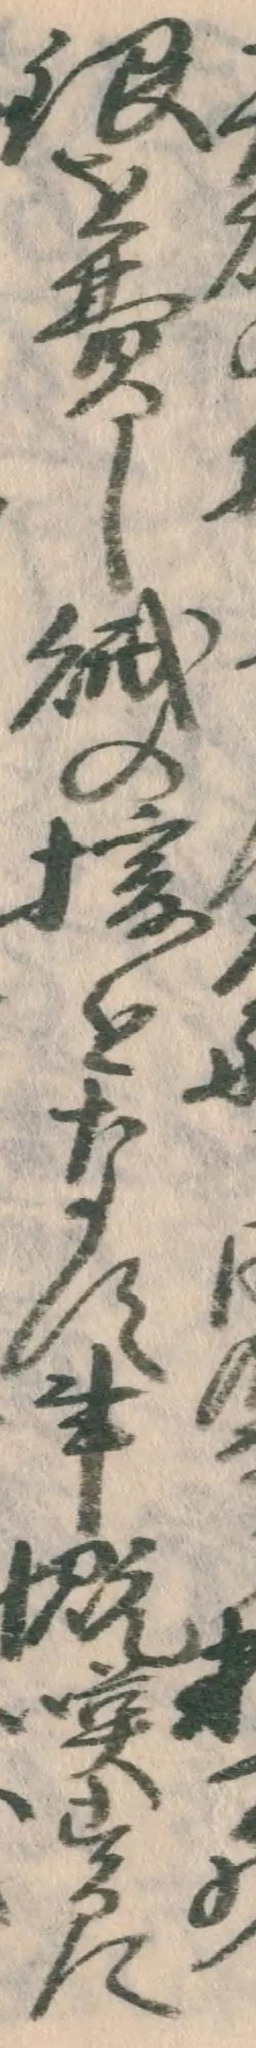銀を費し賊の援をなす事慨嘆するに
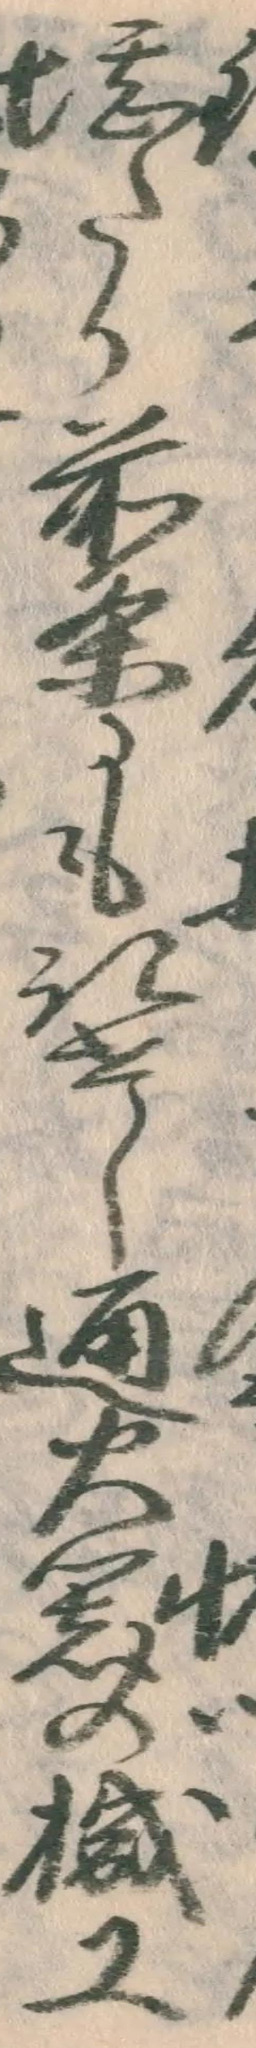堪たり前条にも記せし通火器の機工
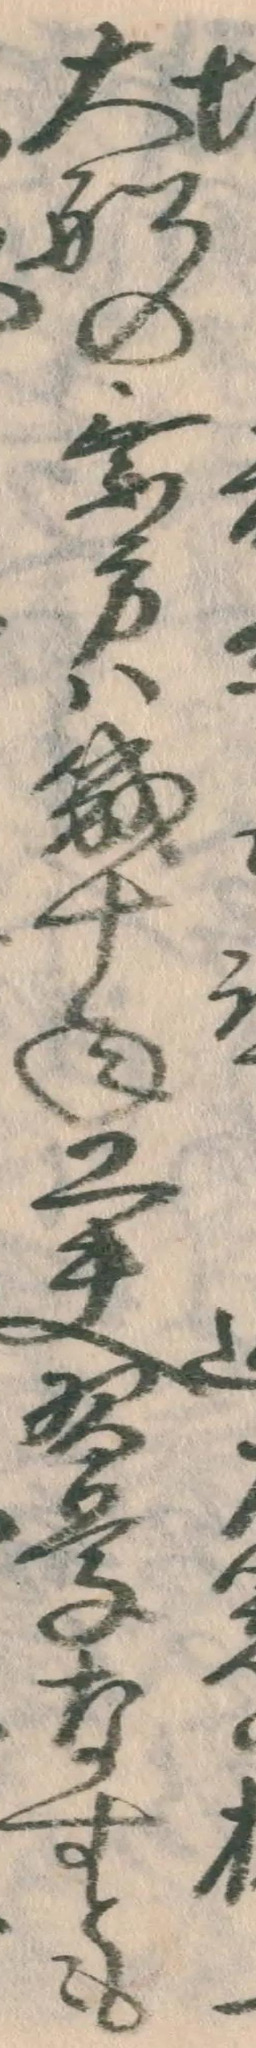大船の乗方ハ幾十年工夫習学なすとも
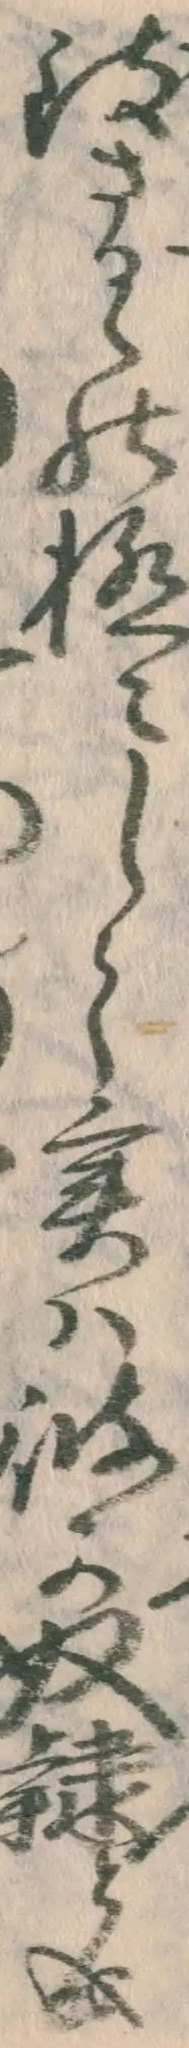致さるゝの極ニして実ハ彼か奴隷と成
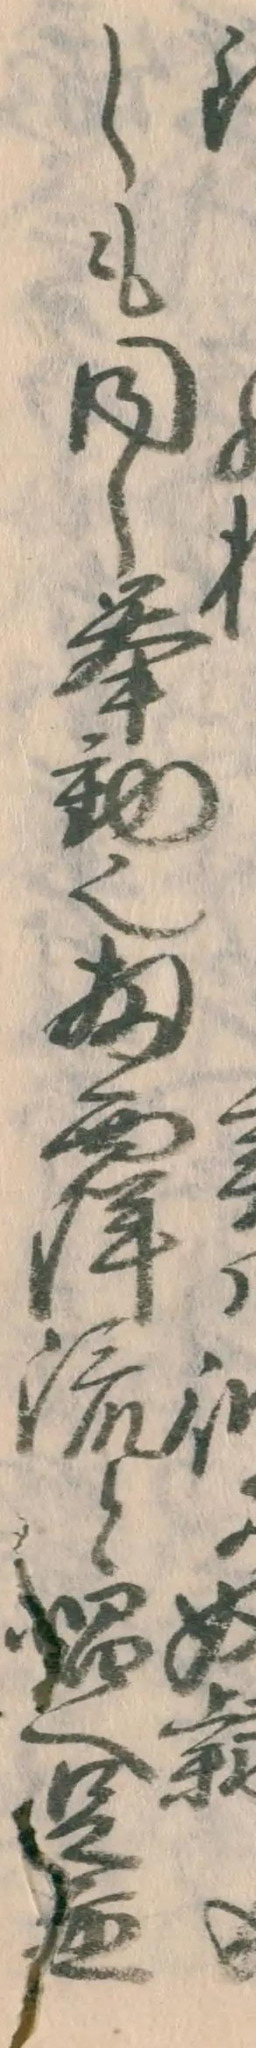しも同し挙動也扠西洋流と唱へ是亦
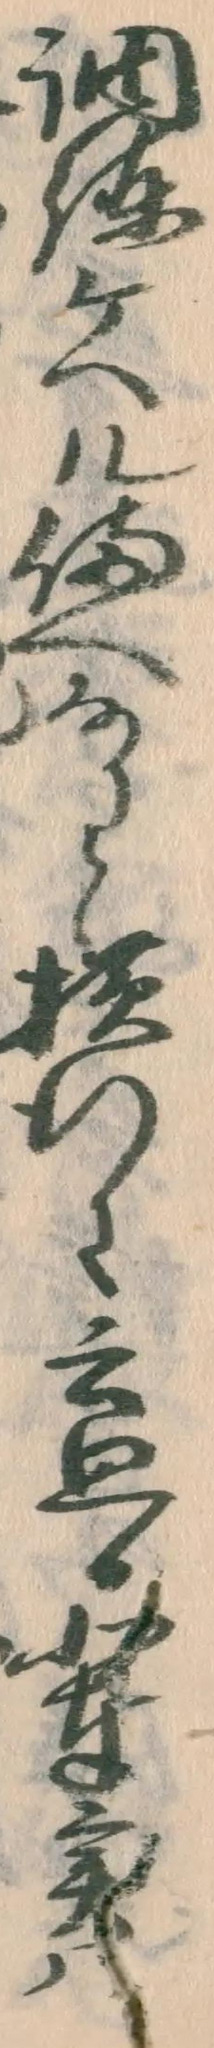調練ケヘル備へなりて横行に云廻る輩実ハ
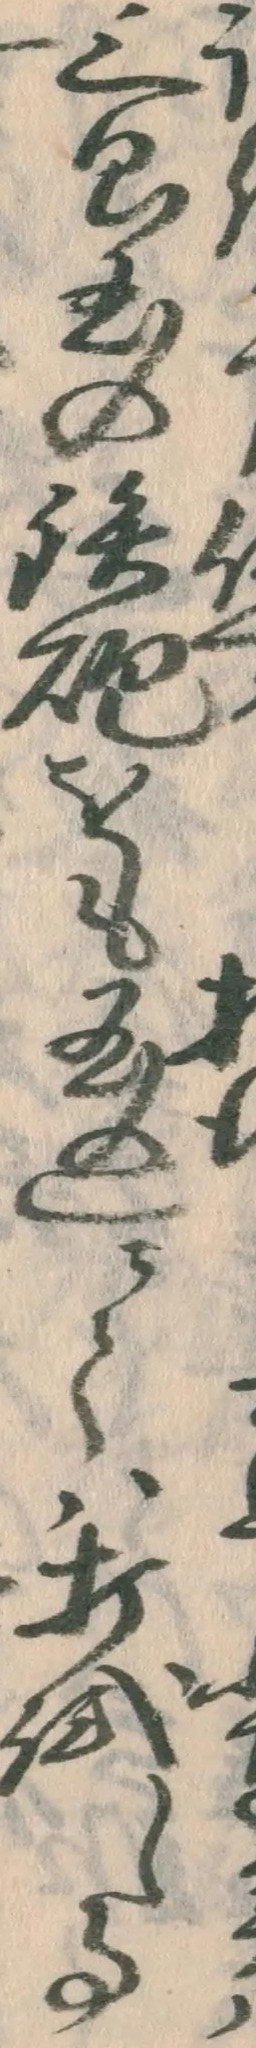三匁玉の鉄砲をも玉込ニてハ打掛し事
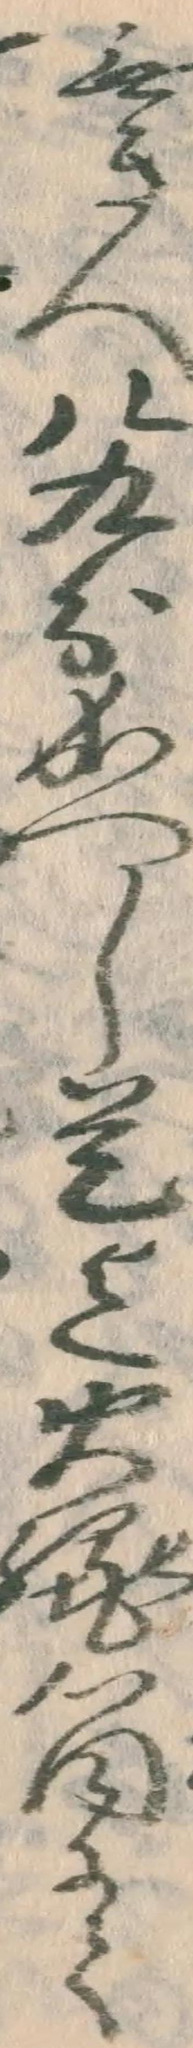無き人八九分成へし是迄火縄筒にて
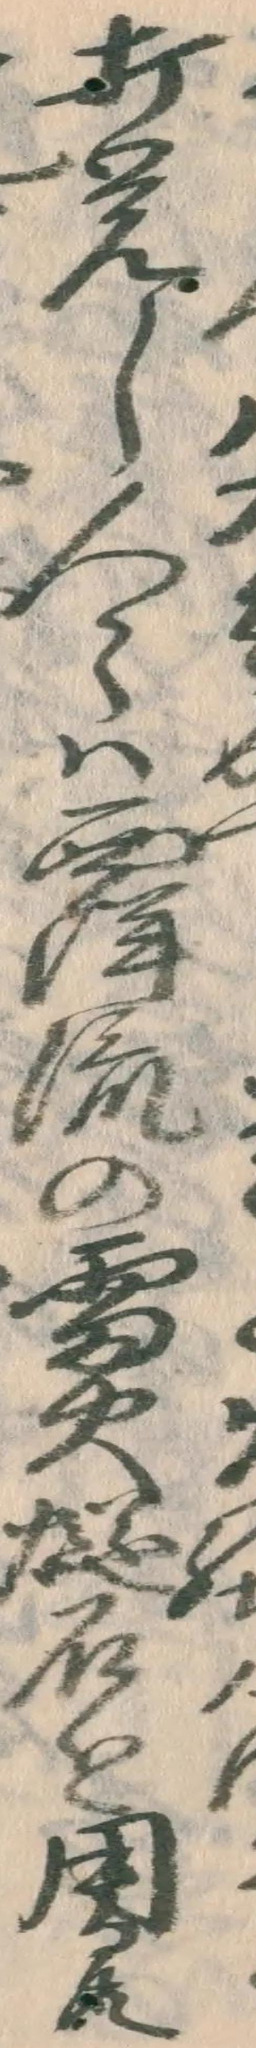打覚し人々ハ西洋流の雷火燧石を用る共
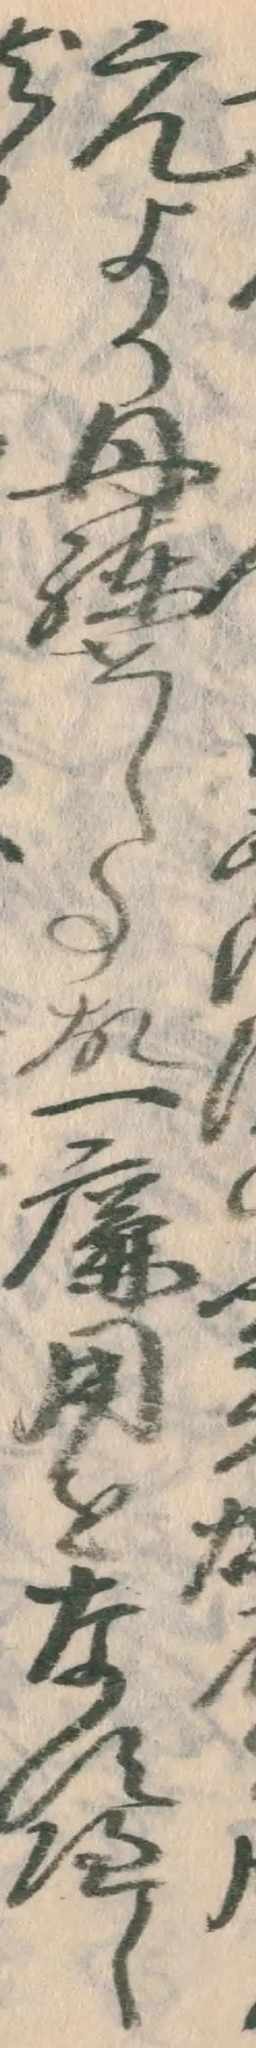元より丹練せし事故一廉用をなすへし
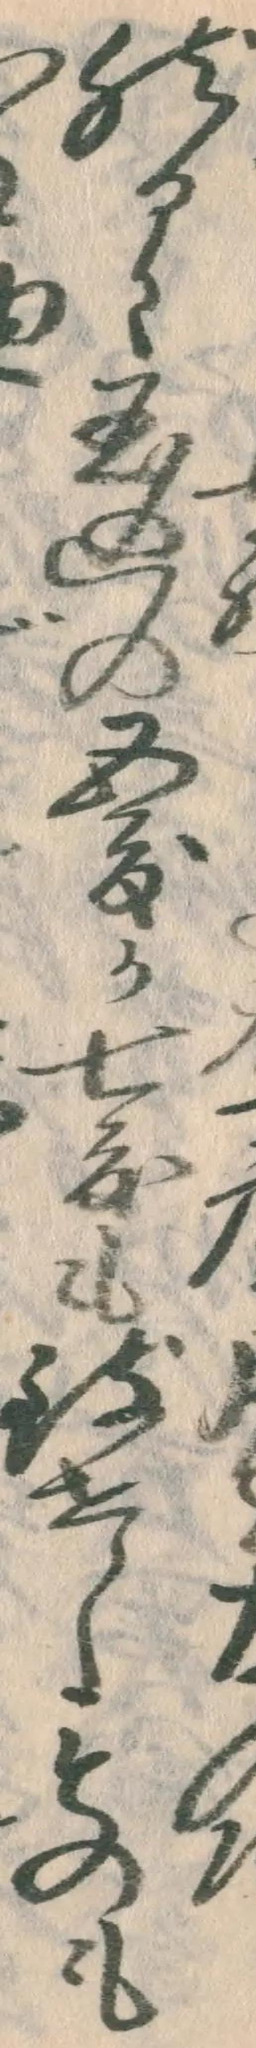然るに玉込の五度か七度も致せしものも
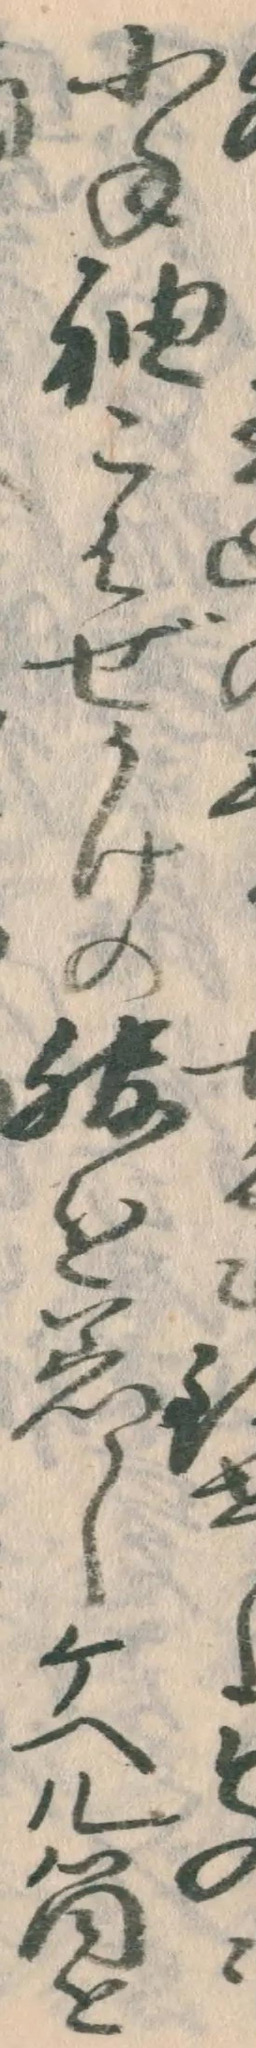小手袖こはぜかけの服を着しケヘル筒を
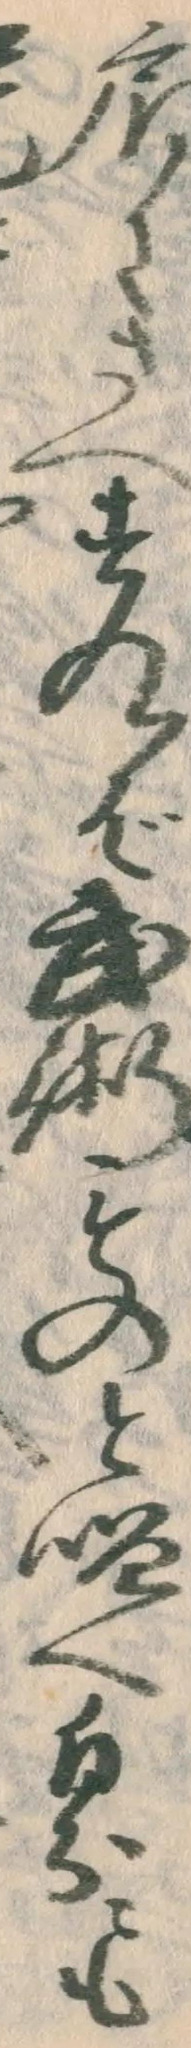肩にさへすれば武術ものと唱へ自分ニも
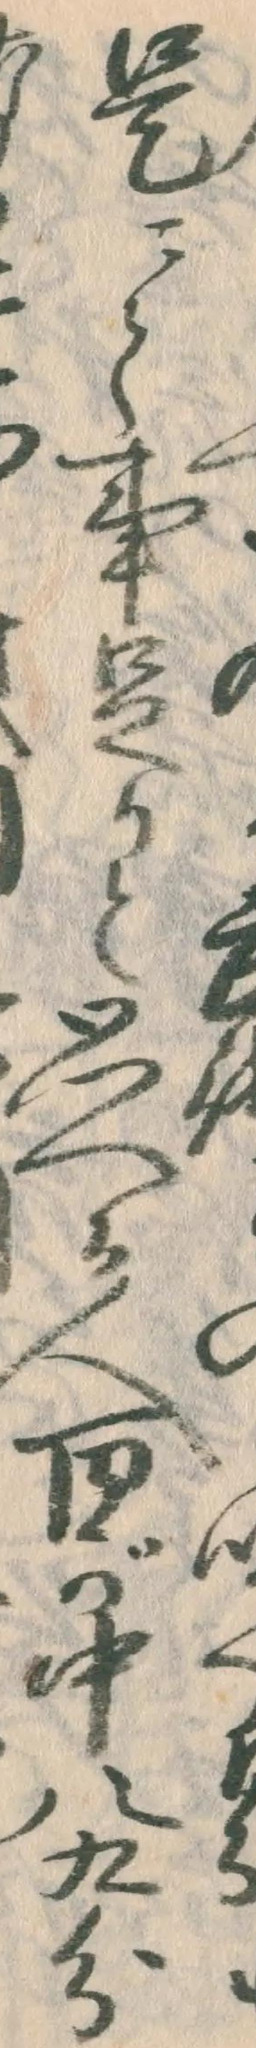是ニて事足りと思へる人百が中八九分
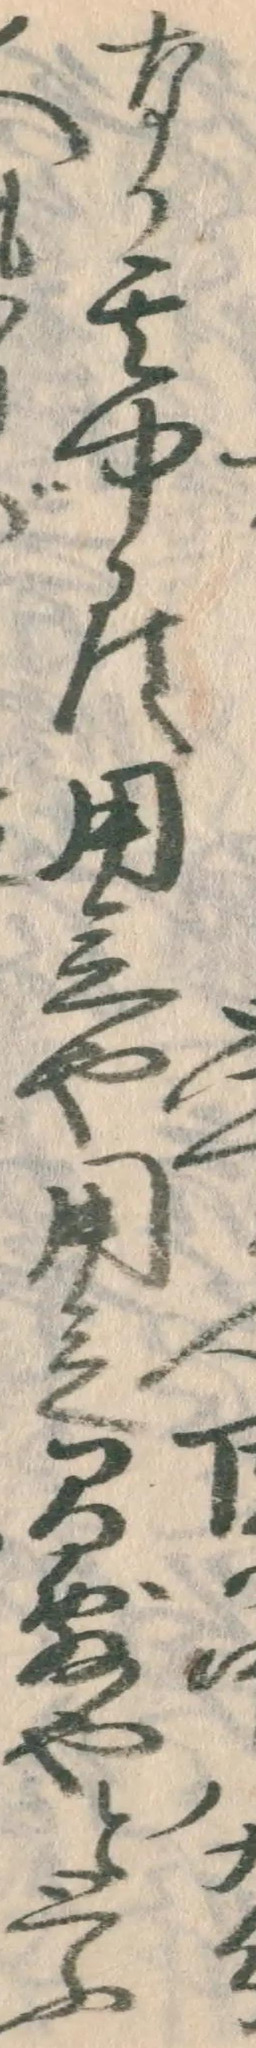なり其中には用立や用立間敷やと思ふ
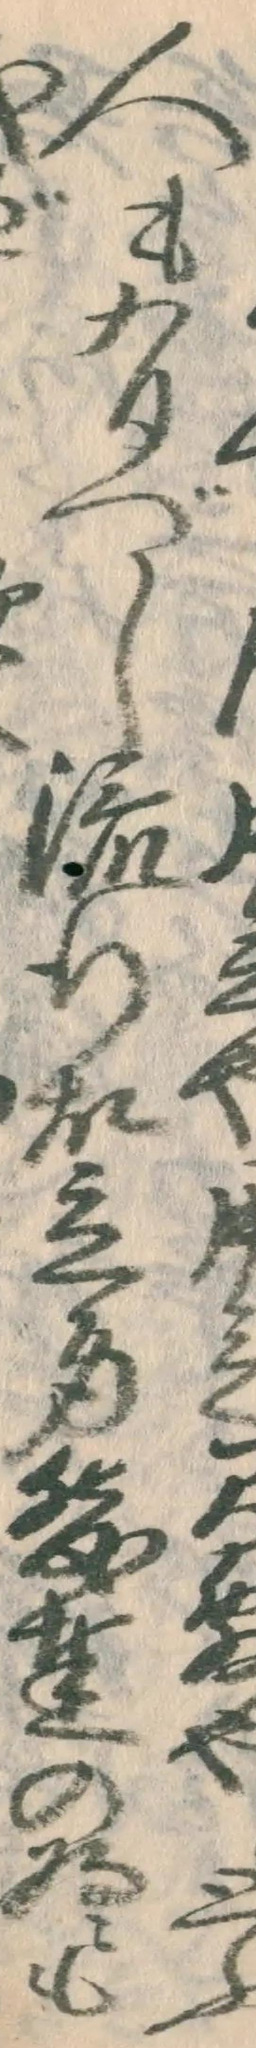人も有べし流行故立身発達の為ニも
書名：麗斎叢書. 20
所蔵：国立国会図書館 National Diet Library, JAPAN
